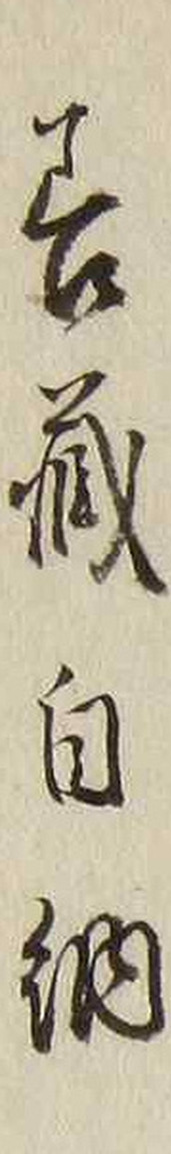善蔵自納

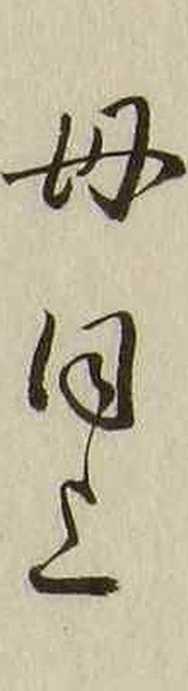母同上
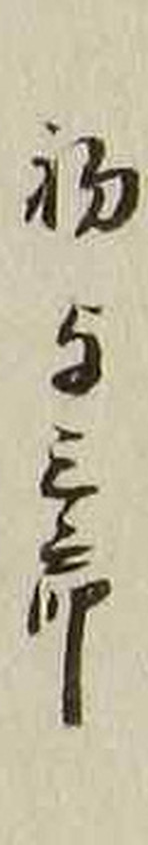初与三郎
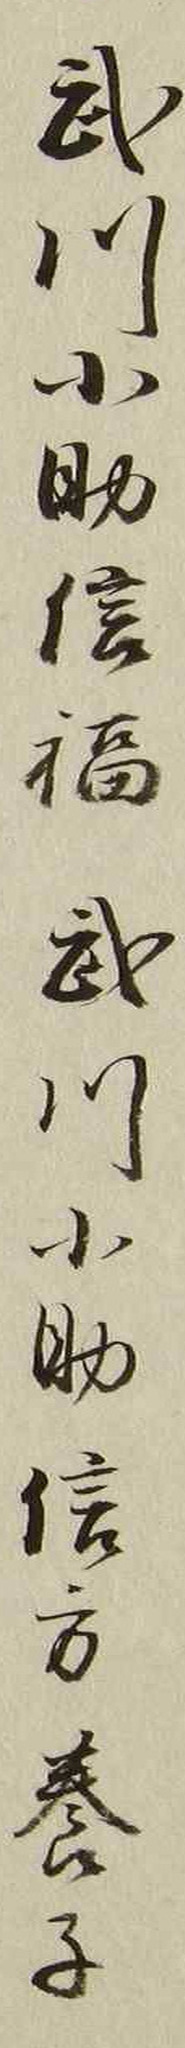弐川小助信福武川小助信方養子
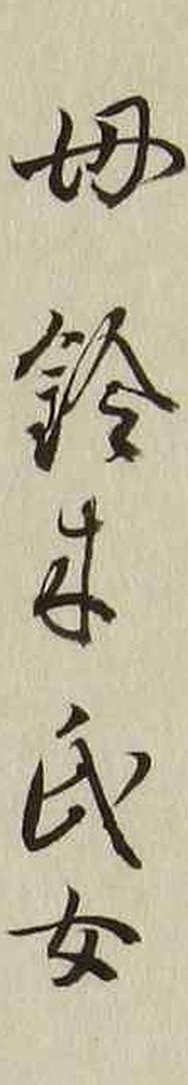母鈴木氏女
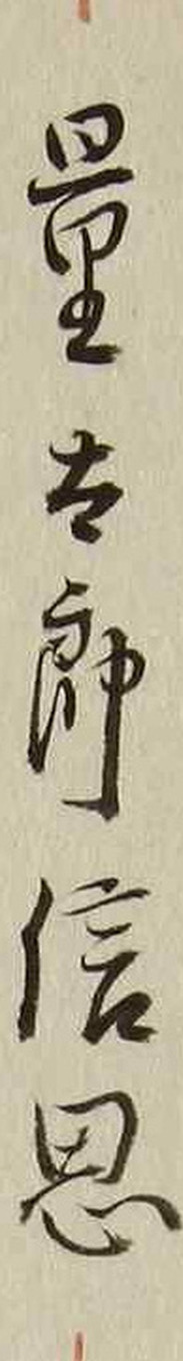量太郎信思
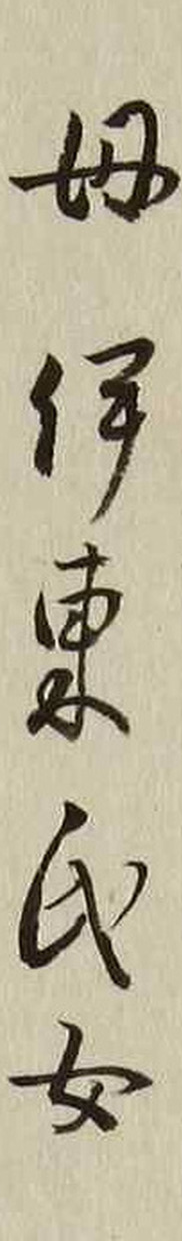母伊東氏女
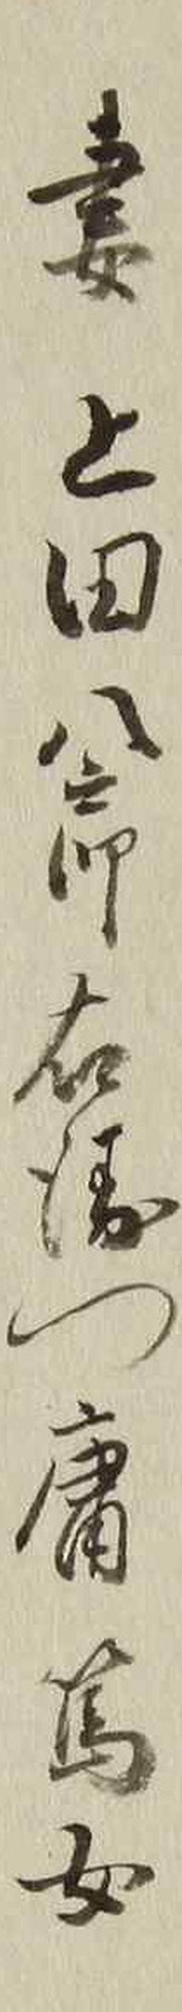妻上田八節右衛門庸馬女
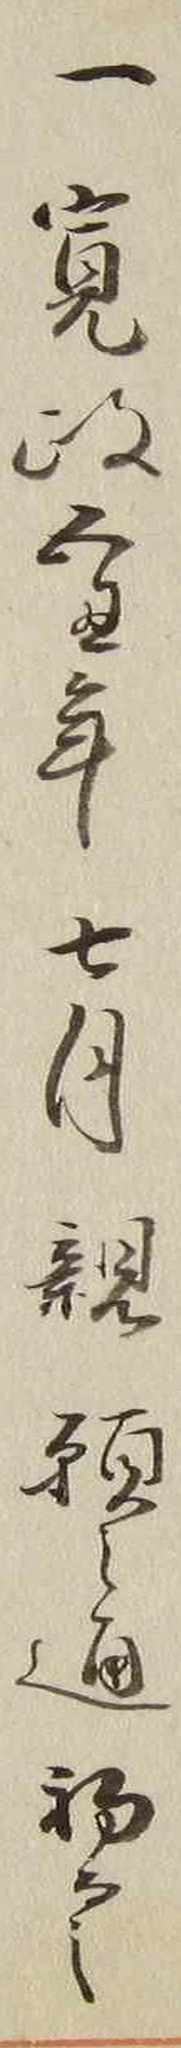一寛政五丑年七月親願之通初而之
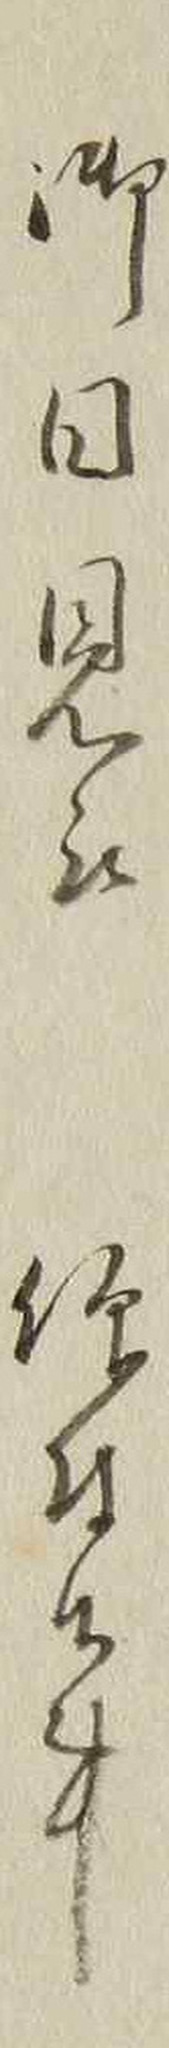御目見被仰付候事
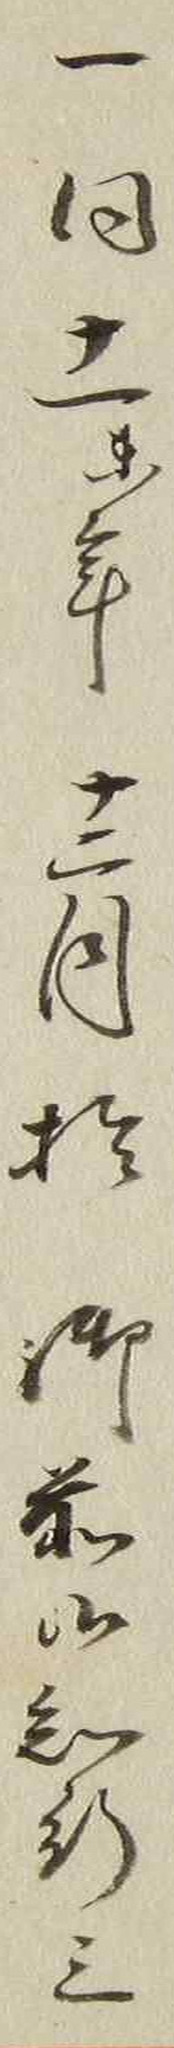一同十一未年十二月於御前御知行三
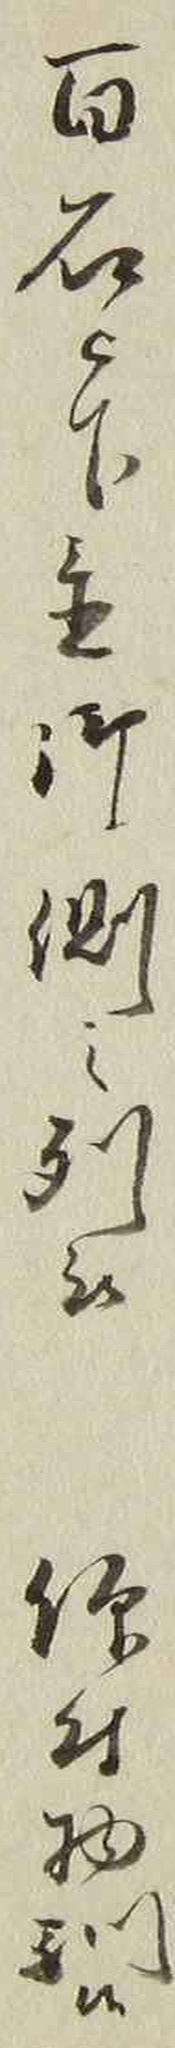百石被下置御側之列被仰付物馴候
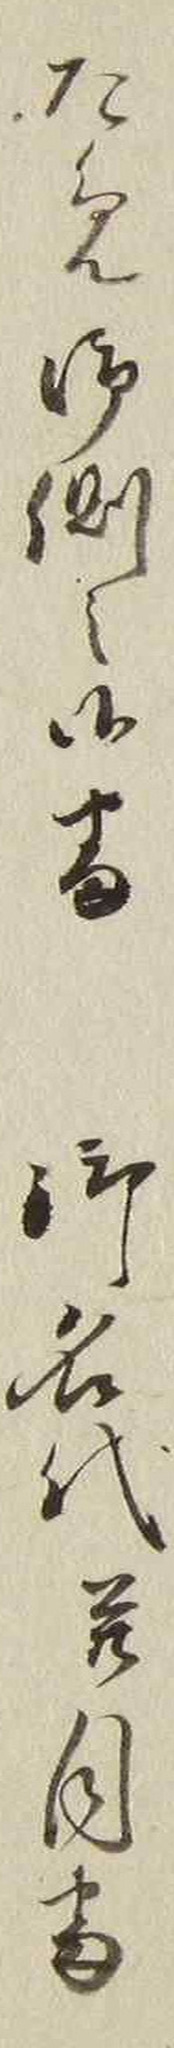ため御側之御番御名代并月番
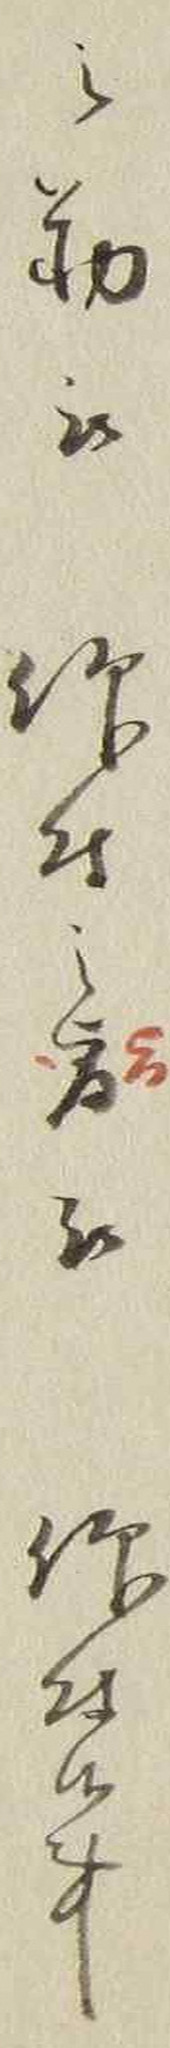之勤被仰付之方被仰付候事
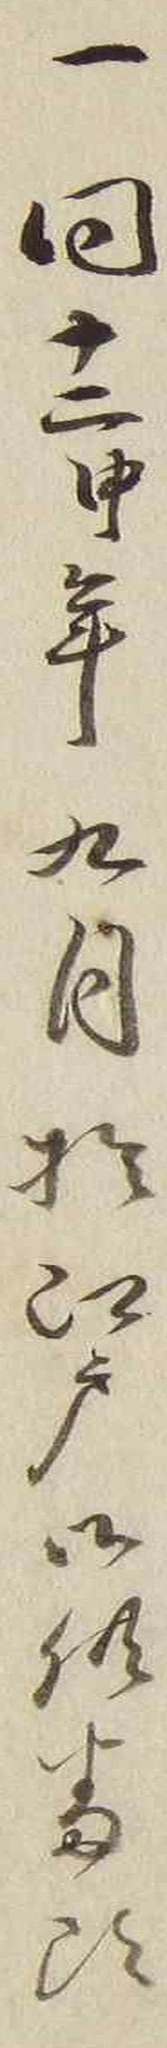一同十二申年九月於江戸御供番頭

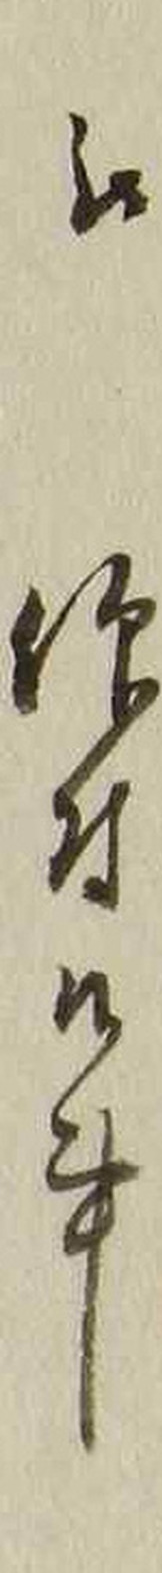被仰付候事
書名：諸士系譜　巻之159　な之部1
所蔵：会津若松市立会津図書館
